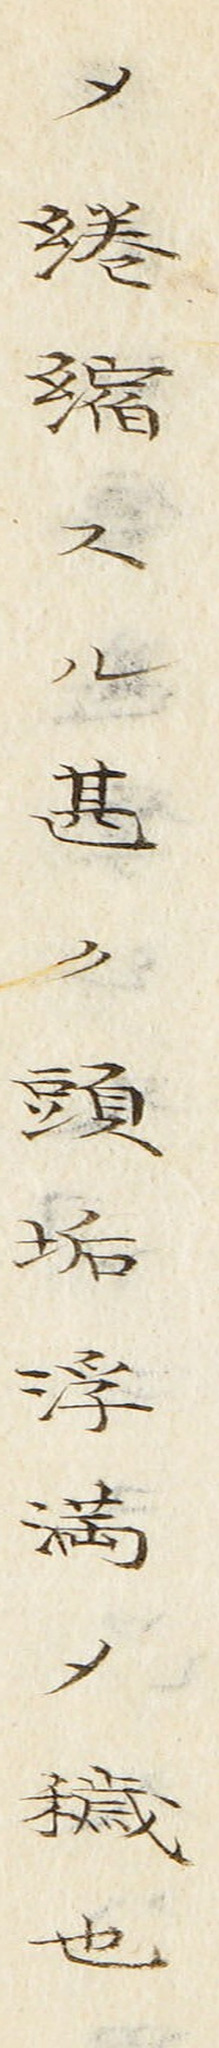シテ綣縮スル甚ク頭垢浮満シテ穢也
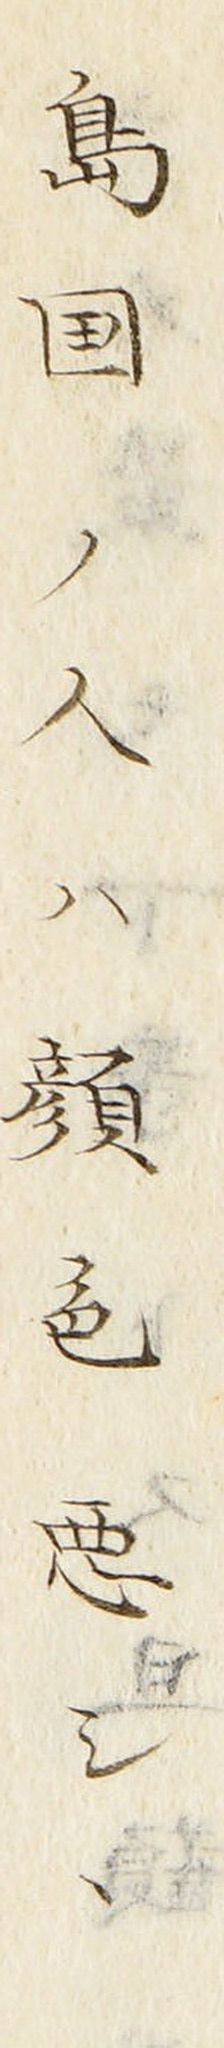〇島国ノ人ハ顔色悪シ
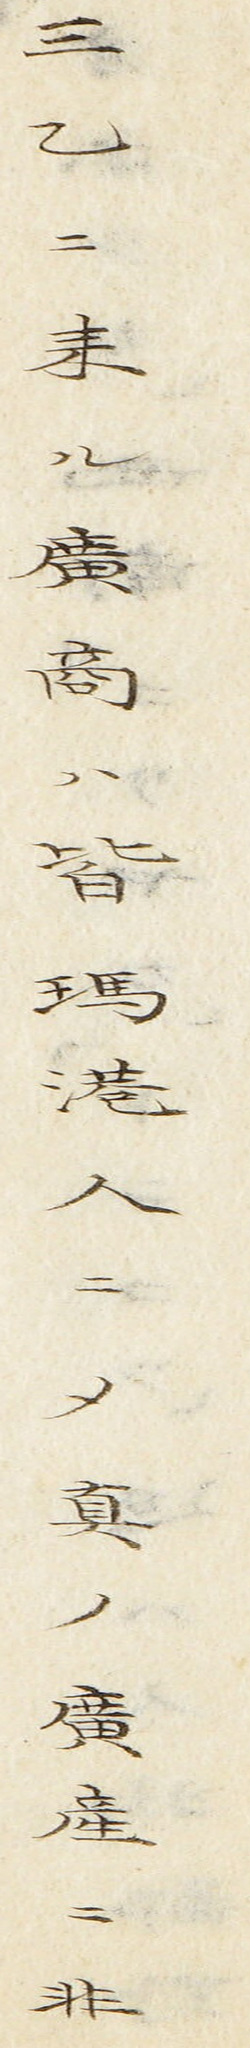〇三乙ニ来ル広商ハ皆瑪港人ニシテ真ノ広産ニ非
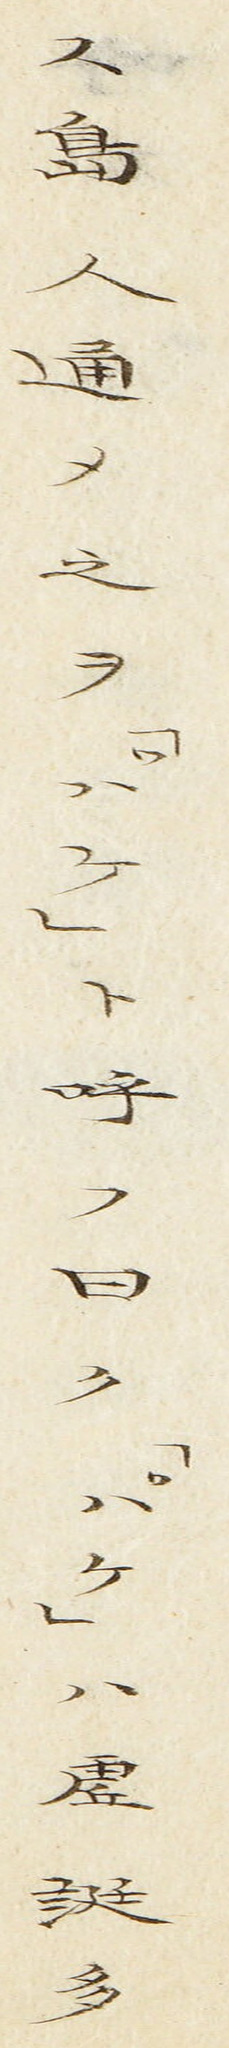ス島人通シテ之ヲ「パケ」ト呼フ曰ク「パケ」ハ虚誕多
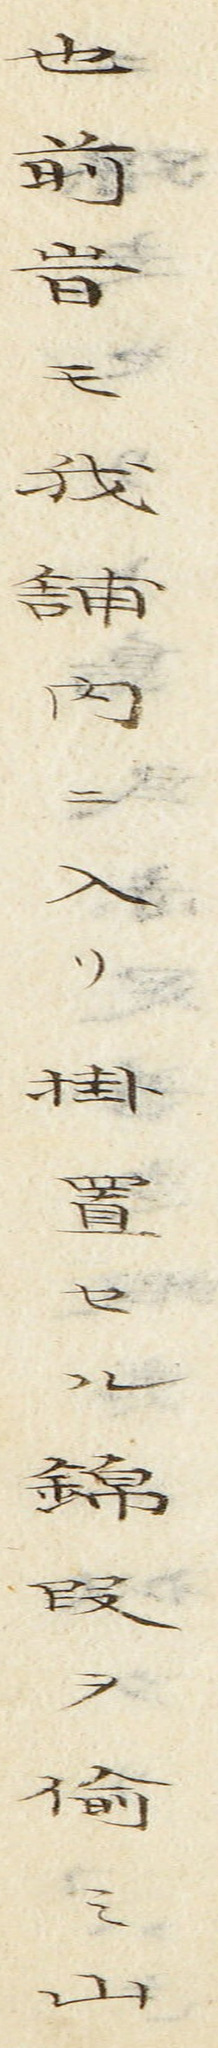也前時モ我舗内ニ入リ掛置セル錦叚ヲ偸ミ山

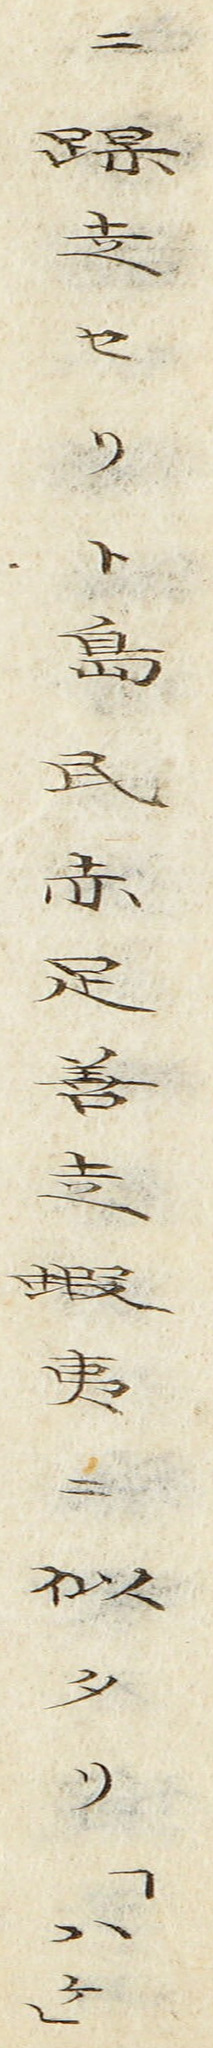ニ踝走セリト島民亦足善走蝦夷ニ似タリ「ハケ」
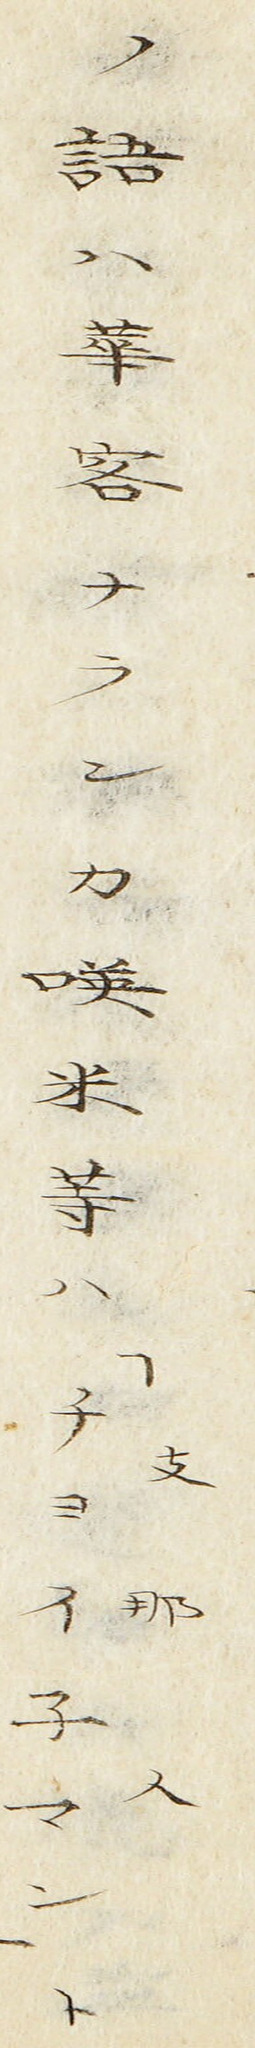ノ語ハ華客ナランカ米等ハ「チヨイネマン」ト
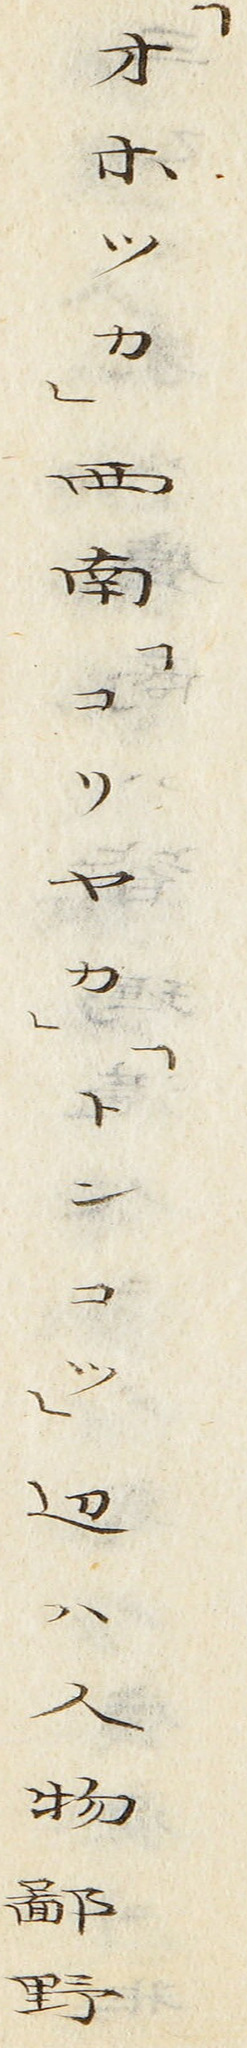〇「オホツカ」西南「ユリヤカ」「トンコツ」辺ハ人物鄙野
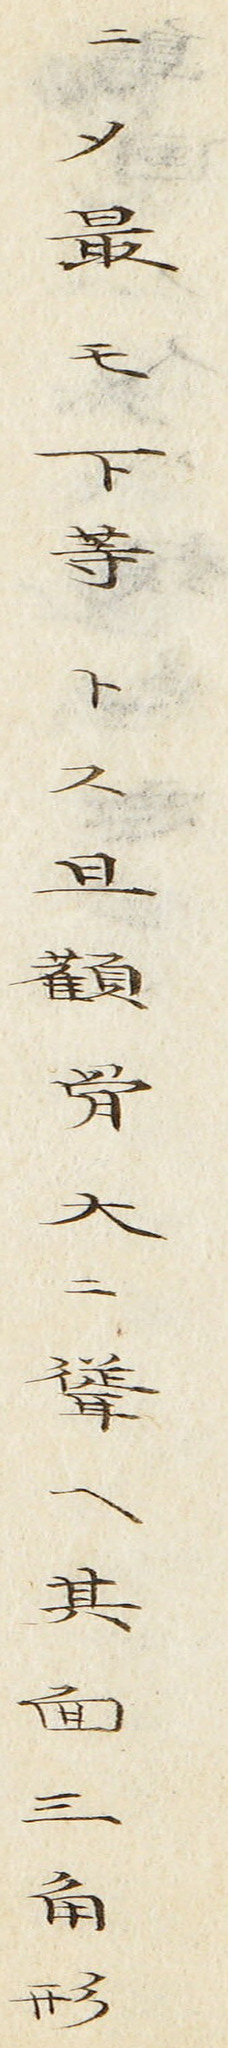ニシテ最モ下等トス旦顴骨大ニ聳ヘ其面三角形
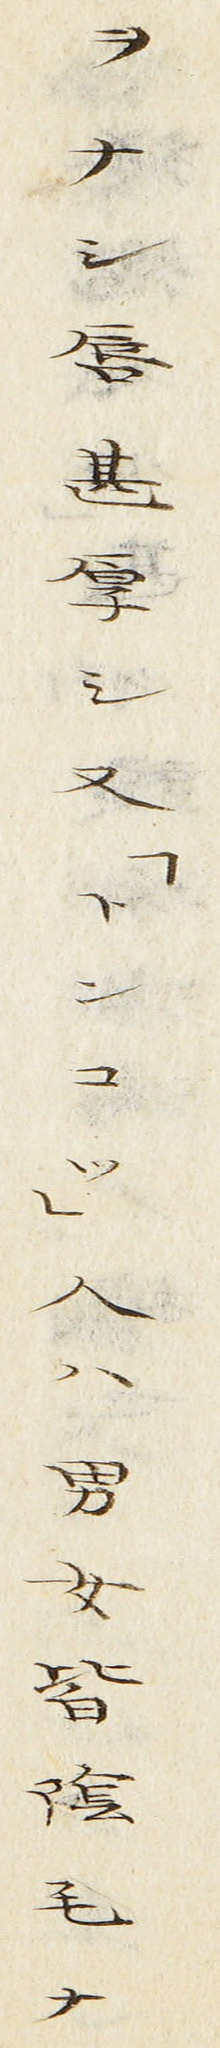ヲナシ唇甚厚シ又「トンコツ」人ハ男女皆陰毛ナ
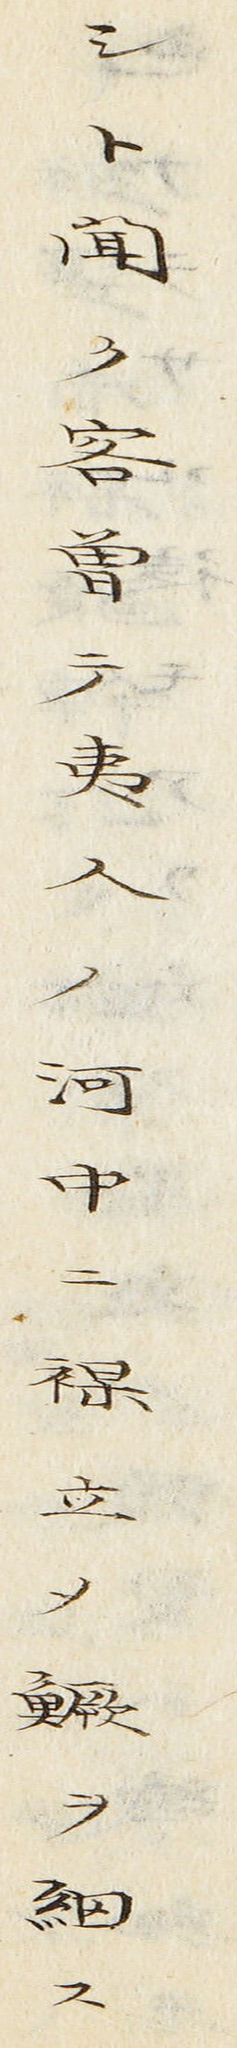シト聞ク客曽テ夷人ノ河中ニ裸立シテ鱖ヲス
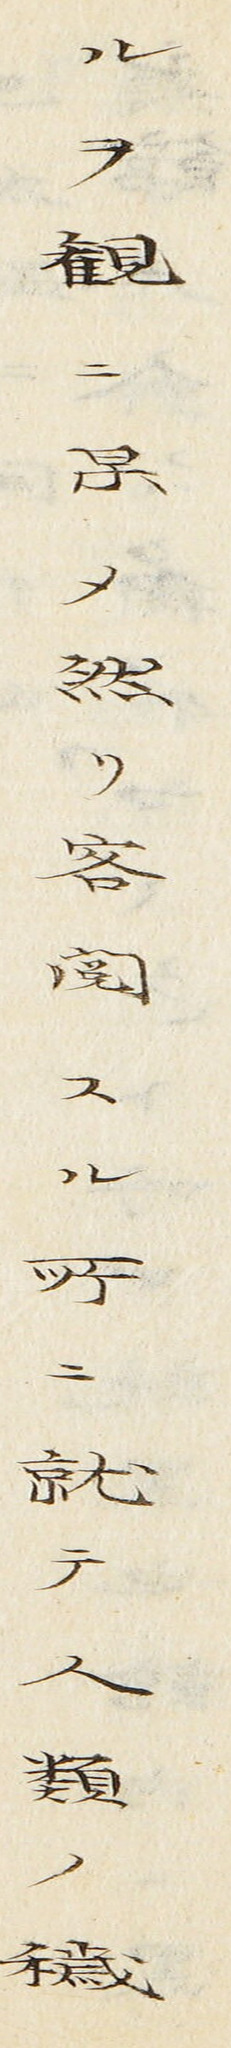ルヲ観ニ果シテ然リ客閲スル所ニ就テ人類ノ穢
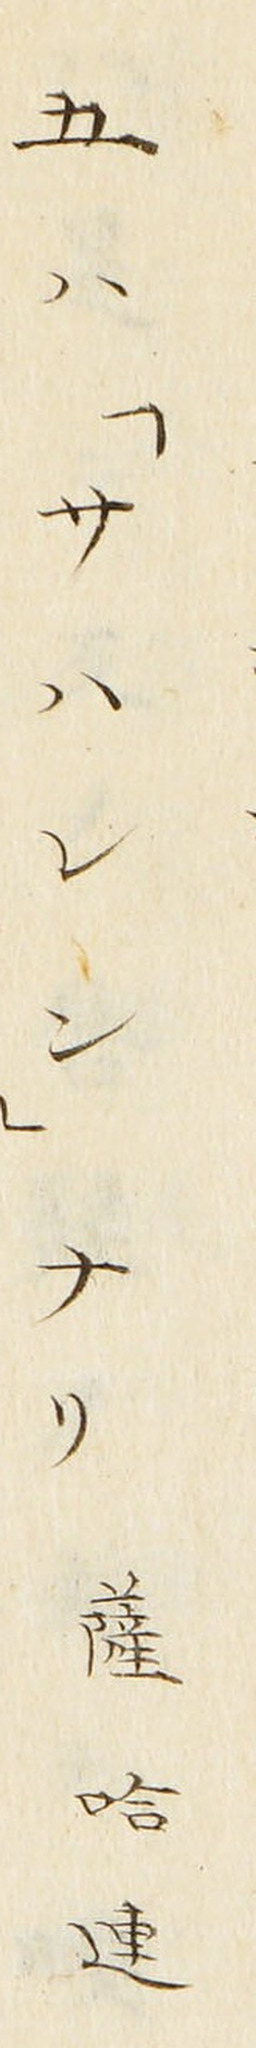五ハ「サハレン」ナリ薩哈連

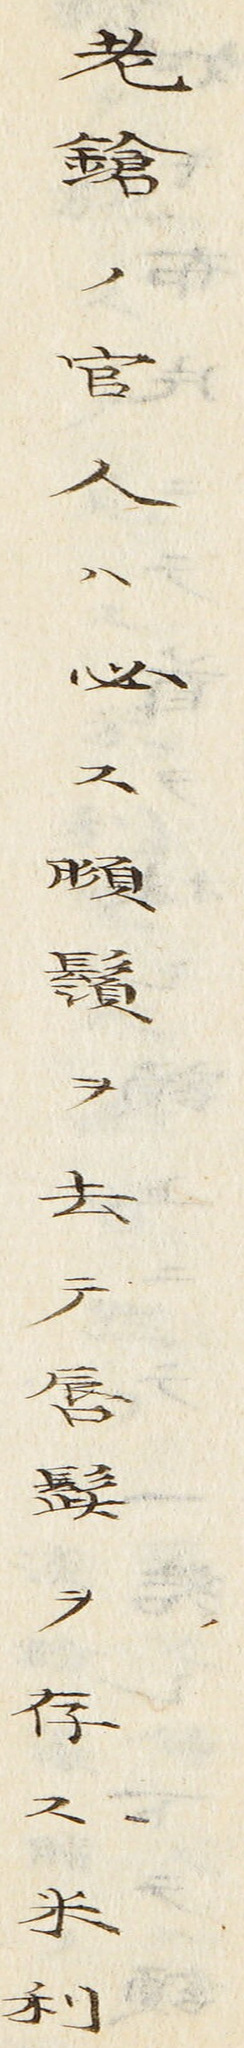〇老鎗ノ官人ハ必ス鬚ヲ去テ唇髭ヲ存ス米利
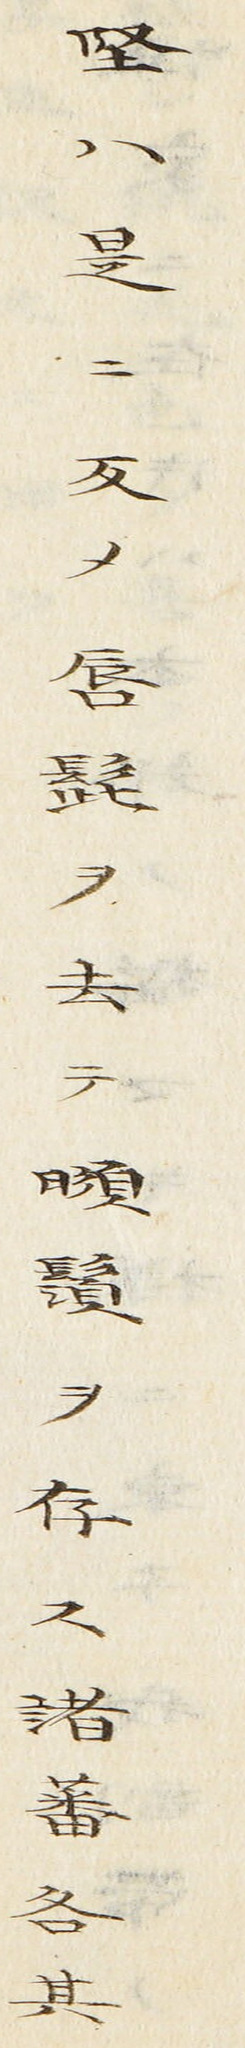堅ハ是ニ反シテ唇髭ヲ去テ鬚ヲ存ス諸蕃各其
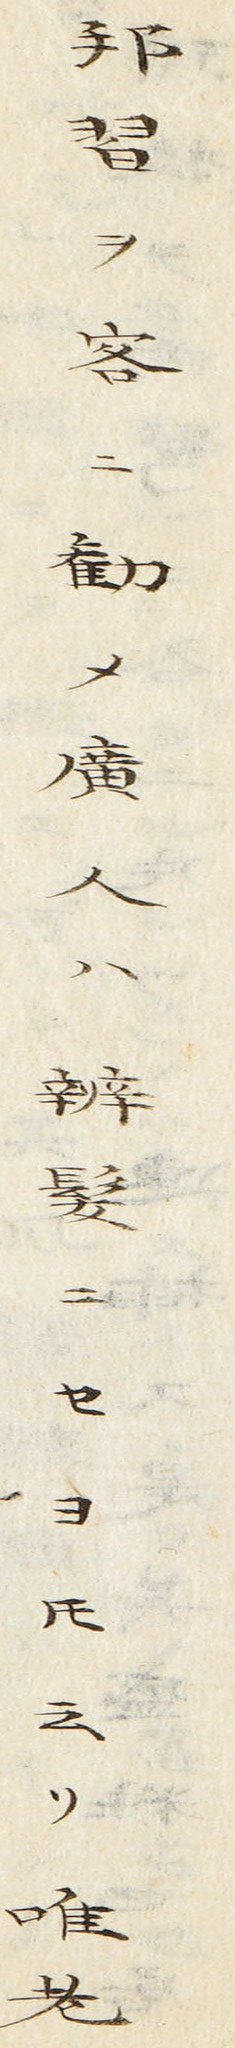邦習ヲ客ニ勧メ広人ハ辮髪ニセヨトモ云リ唯老
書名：蕃談
